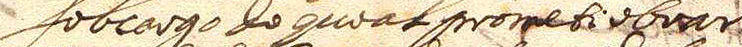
sob cargo do quoal prometi obrar
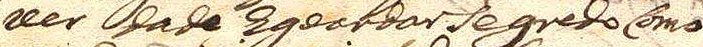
verdade E goardar segredo Como
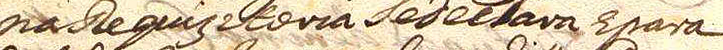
na Requizitoria se declara E para
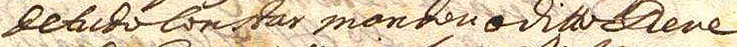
de tudo Constar mandou o ditto Reve
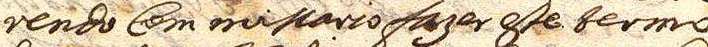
rendo Commissario fazer este termo
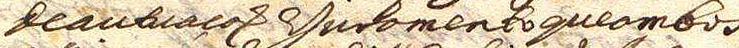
de autuaçaõ E juramento que ambos
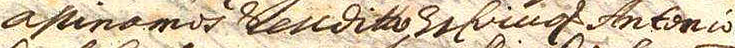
assinamos E eu ditto EsCriuaõ Antonio
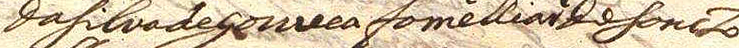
da Silva de Gouuea fomelliar do sancto
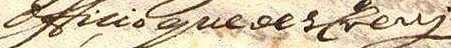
Offiçio que o esCreuj
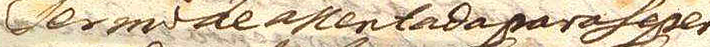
Termo de assentada para se per
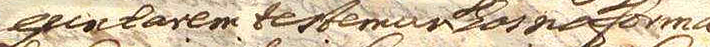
guntarem testemunhas na forma
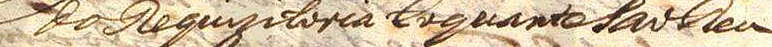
da Requizitoria toquantes ao Reo
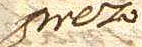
prezo
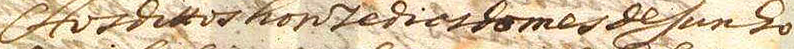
Aos dittos honze dias do mes de Junho
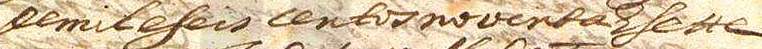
de mil e seiscentos noventa E sette
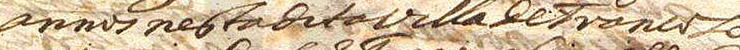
annos nesta dita villa de Trancoso
